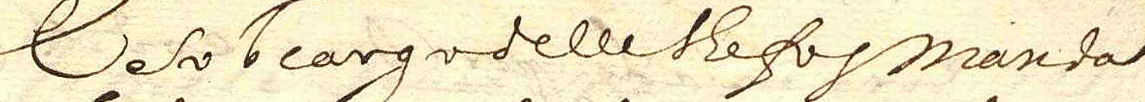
E sob cargo delle lhe foj manda
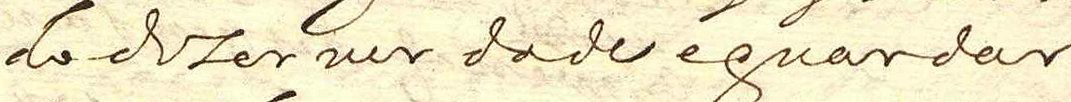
do dizer uerdade e guardar
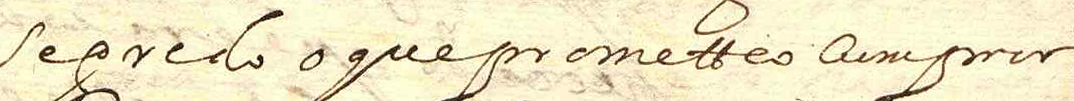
segredo o que prometteo cumprir
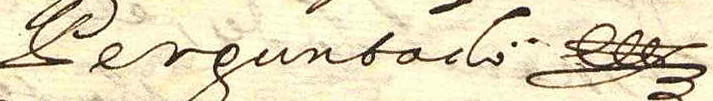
Perguntado
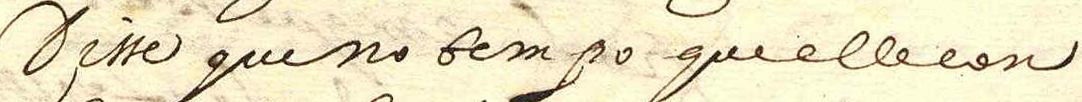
Disse que no tempo que elle con
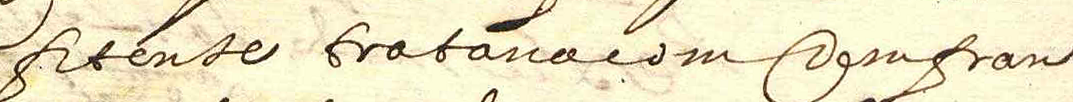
fitente trataua com Dom fran
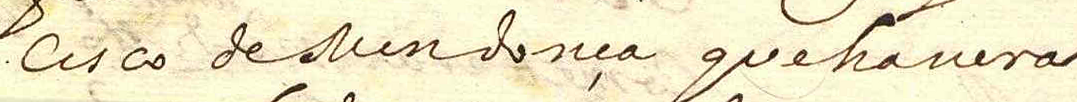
cisco de Mendonça que hauera
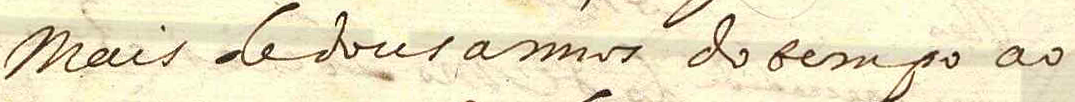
mais de dous annos do tempo ao
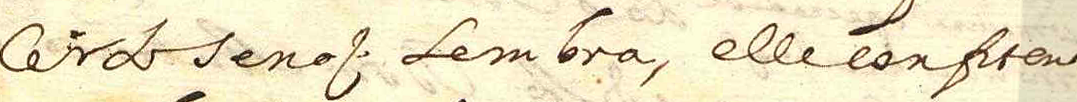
certo se naõ lembra, elle confiten
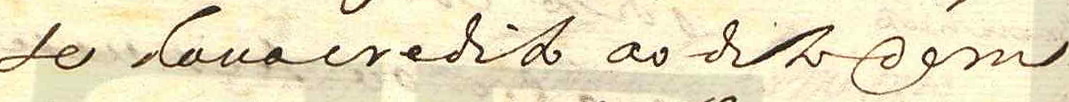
te daua credito ao dito dom
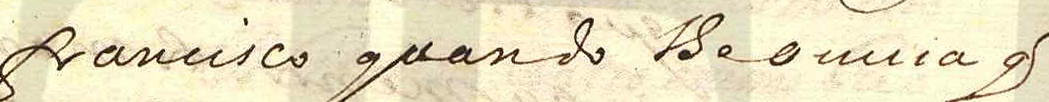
francisco quando lhe ouuia q̄
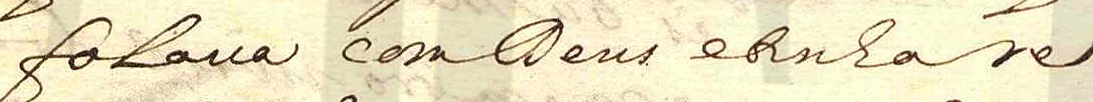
falaua com Deus e tinha re
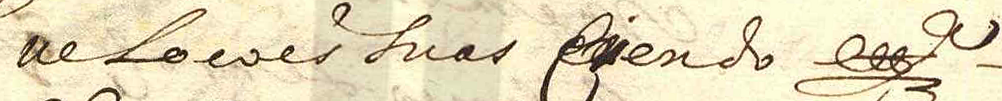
uelocoes̄ suas C_endo etta
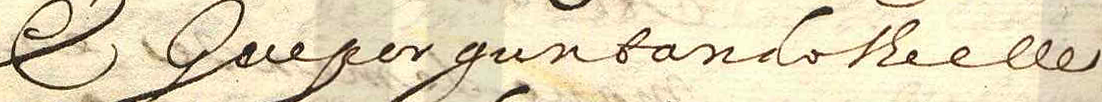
E Que perguntadolhe elle
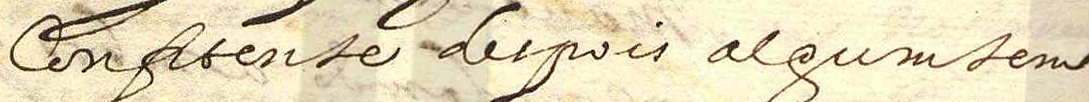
Confitente despois algum tem
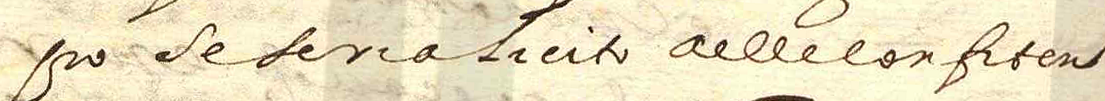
po se seria licito a elle confiten
